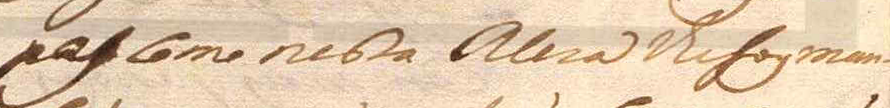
pas como nesta Meza lhe foy man
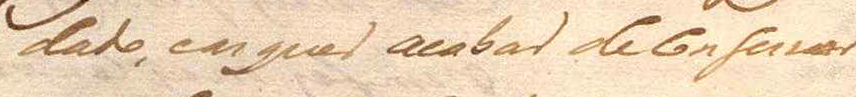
dado, e as quer acabar de confessar
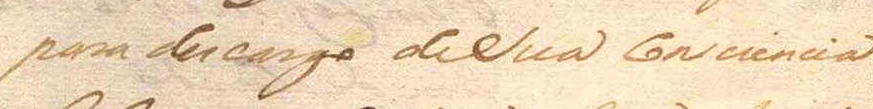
para descargo de sua consciencia
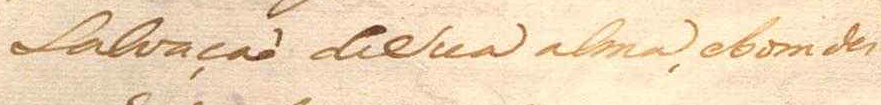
salvaçaõ de sua alma, e bom des
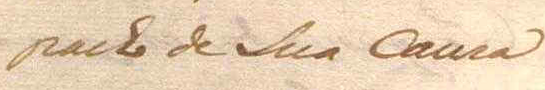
pacho de sua cauza
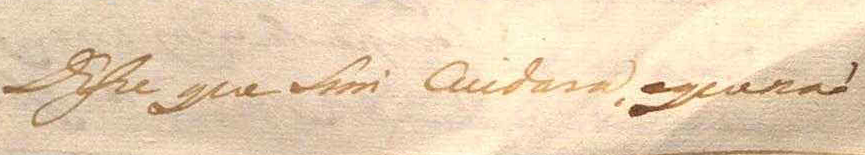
Disse que sim cuidara, e que naõ
